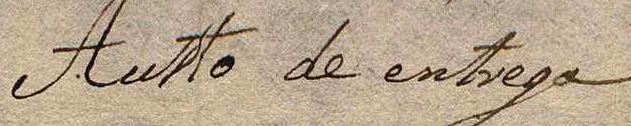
Autto de entrega
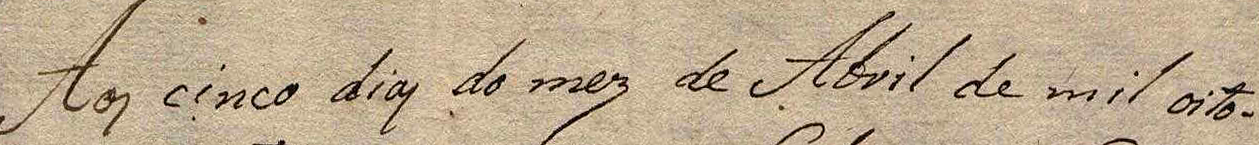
Aos cinco dias do mez de Abril de mil oito
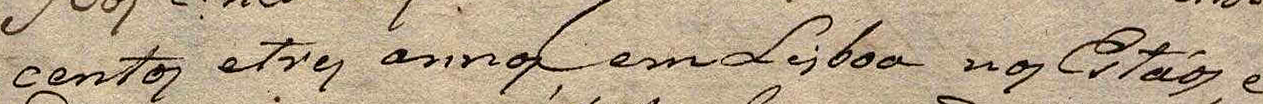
centos e tres annos, em Lisboa nos Estáos, e
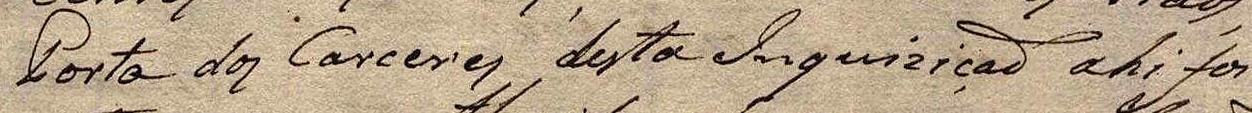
Porta dos Carceres desta Inquizição ahi foi
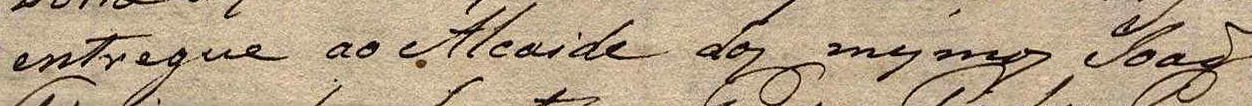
entregue ao Alcaide dos mesmos Ioaõ
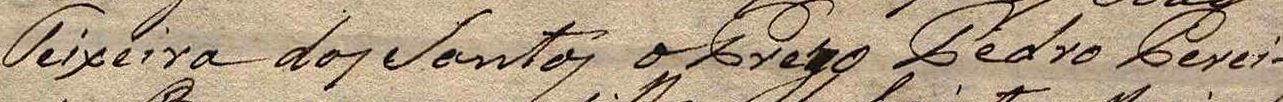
Teixeira dos Santos o Prezo Pedro Perei
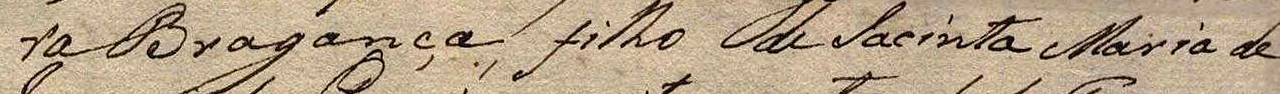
ra Bragança, filho de Iacinta Maria de
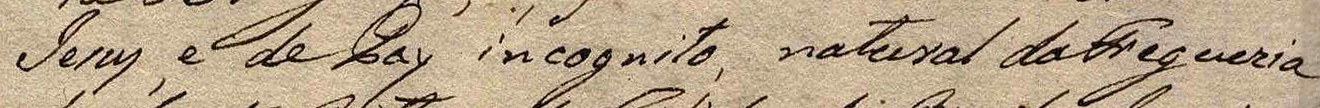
Iesus, e de Pay incognito, natural da Freguezia
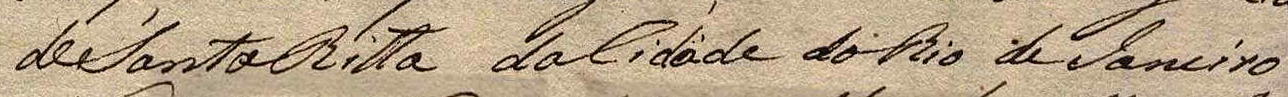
da Santa Ritta da Cidade do Rio de Ianeiro
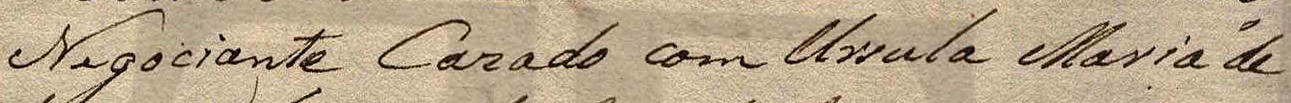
Negociante, Cazado com Ursula Maria de
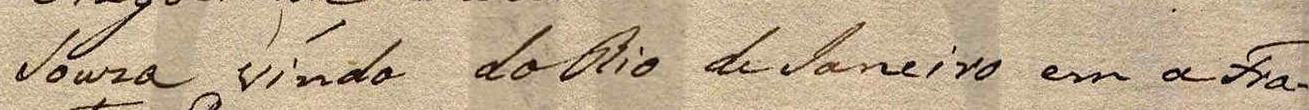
Souza vindo do Rio de Ianeiro em a Fra
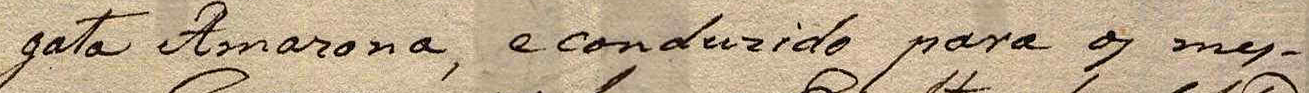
gata Amazona, e conduzido para os mes
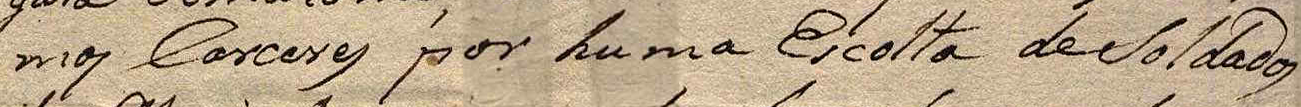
mos Carceres por huma Escolta de Soldados
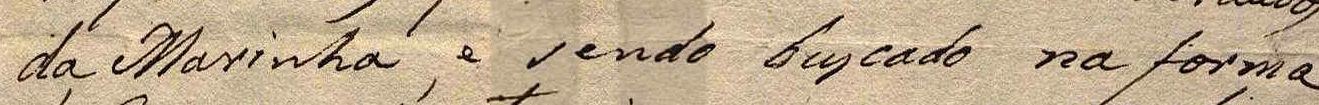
da Marinha, e sendo buscado na forma
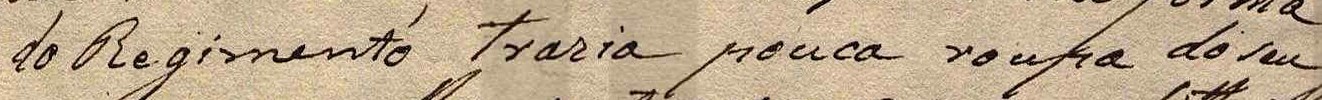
do Regimento trazia pouca roupa do seu
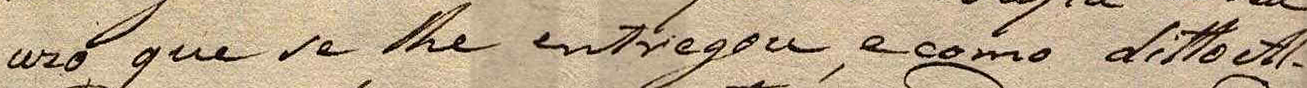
uzo, que se lhe entregou, e como ditto Al
